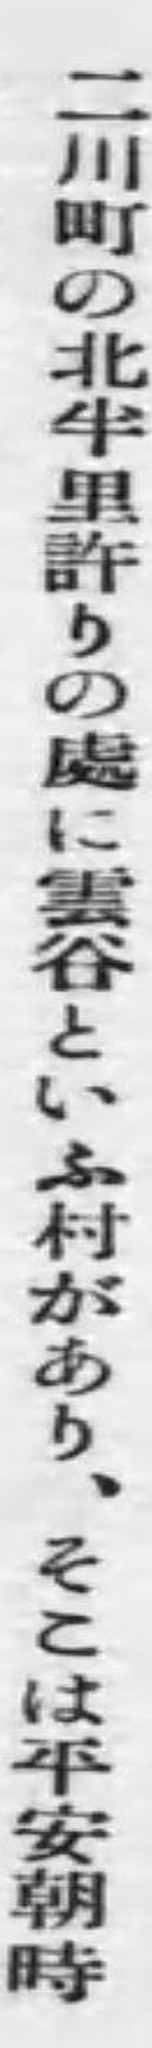二川町の北半里許りの処に雲谷といふ村があり、そこは平安朝時
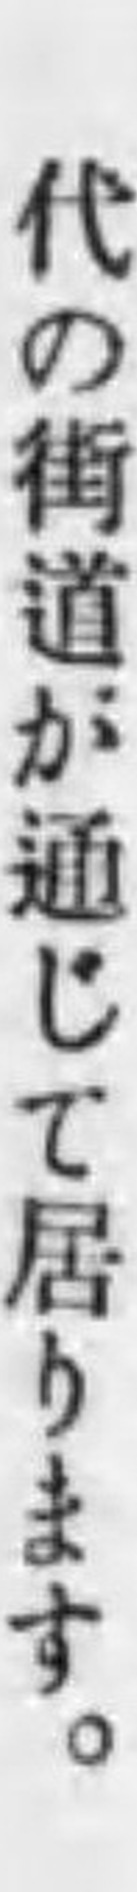代の街道が通じて居ります。
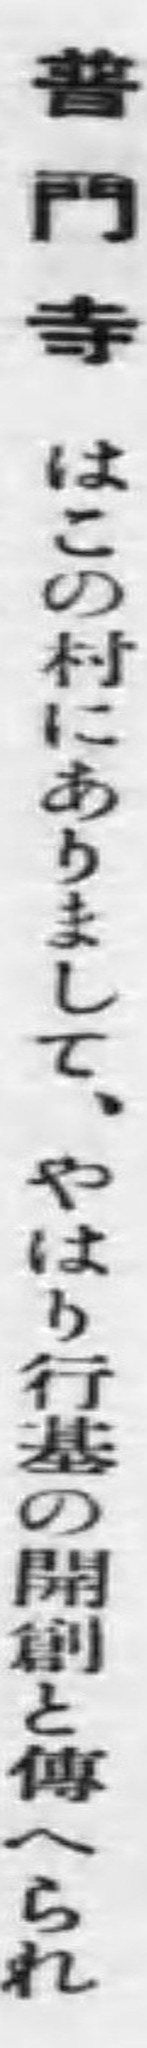普門寺はこの村にありまして、やはり行基の開創と伝へられ
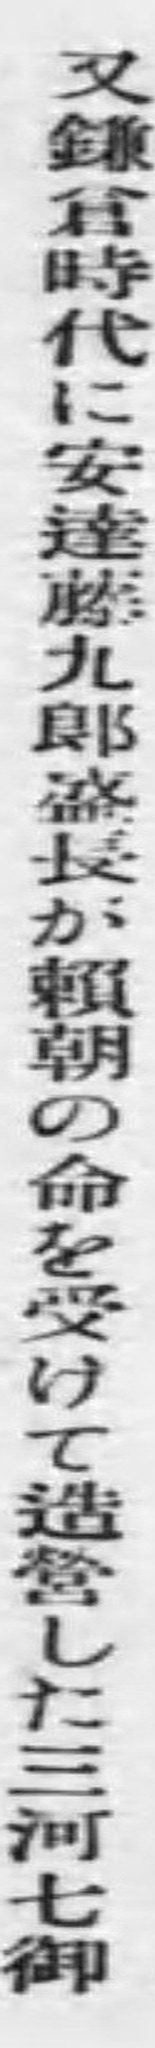又鎌倉時代に安達藤九郎盛長が頼朝の命を受けて造営した三河七御
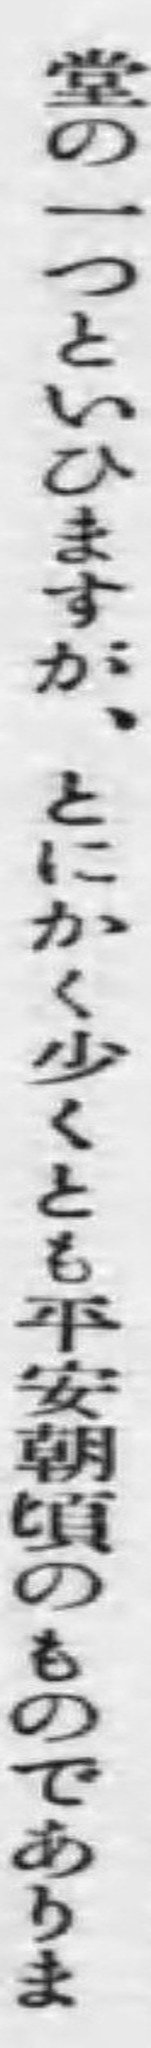堂の一つといひますが、とにかく少くとも平安朝頃のものでありま
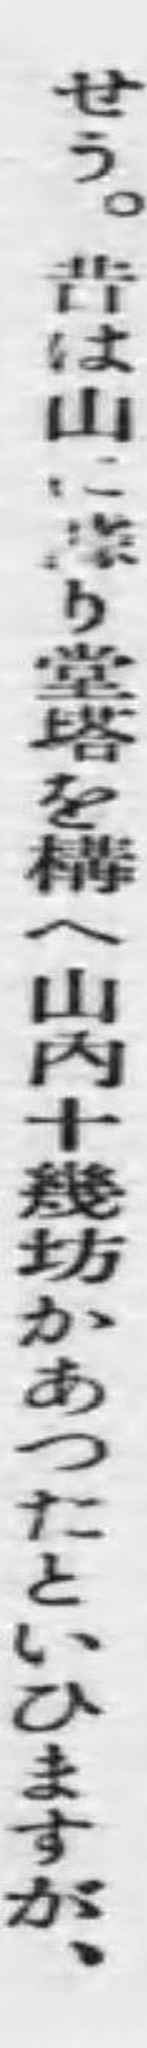せう。昔は山に拠り堂塔を構へ山内十幾坊かあつたといひますが、
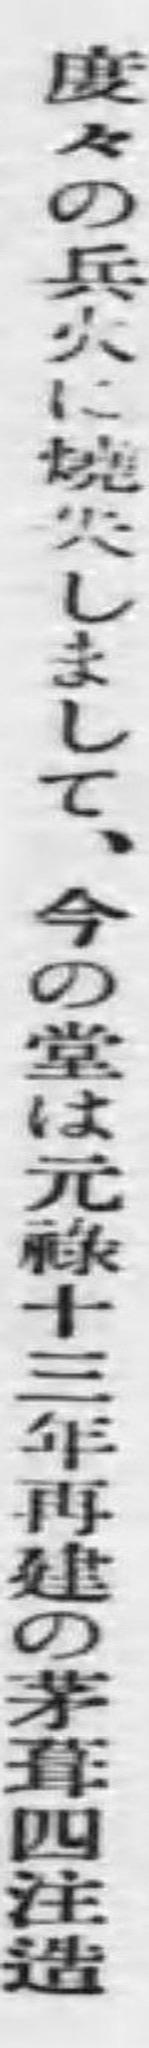度々の兵火に焼失しまして、今の堂は元禄十三年再建の茅葺四注造
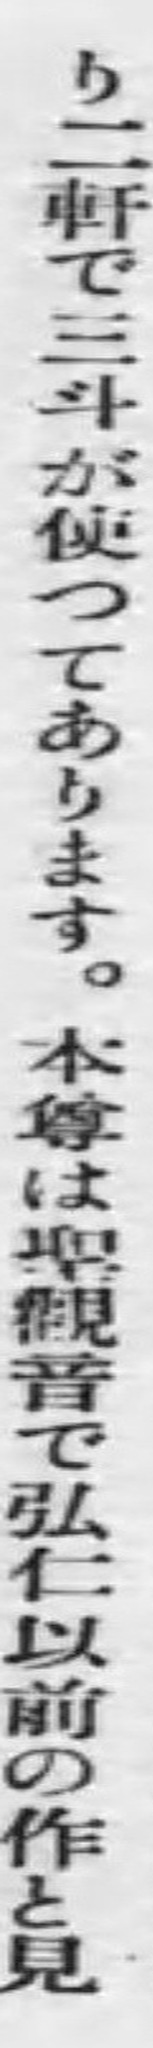り二軒で三斗が使つてあります。本尊は聖観音で弘仁以前の作と見
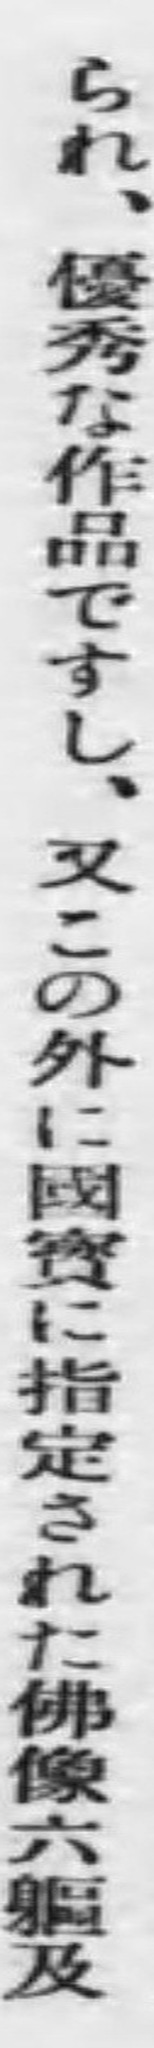られ、優秀な作品ですし、又この外に国宝に指定された仏像六軀及
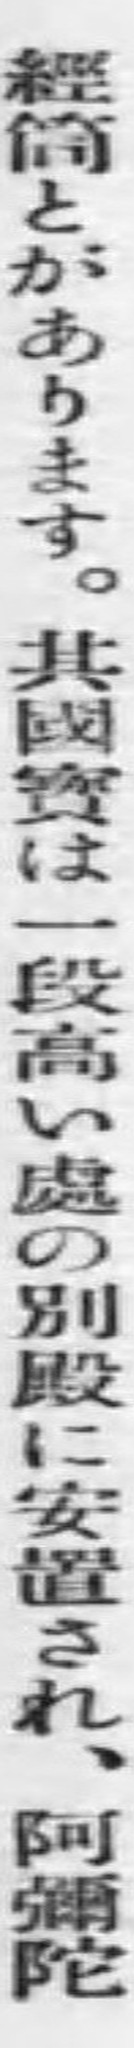経筒とがあります。其国宝は一段高い処の別殿に安置され、阿弥陀
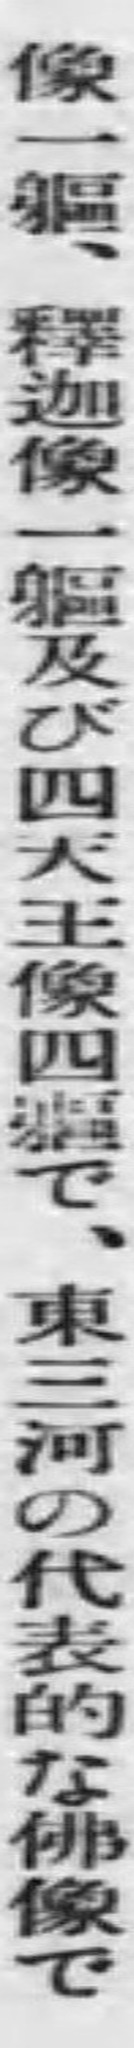像一軀、釈迦像一軀及び四天王像四軀で、東三河の代表的な仏像で
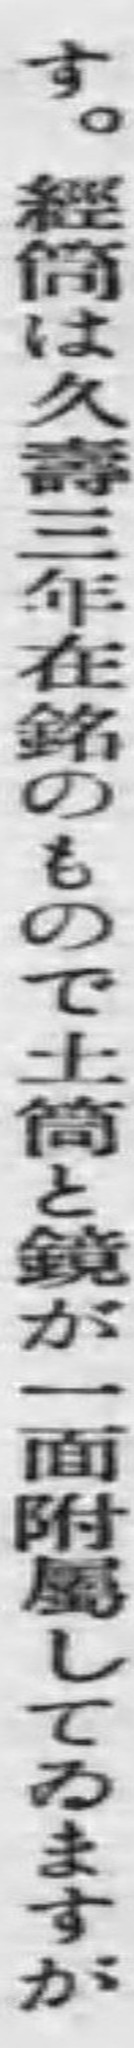す。経筒は久寿三年在銘のもので土筒と鏡が一面附属してゐますが
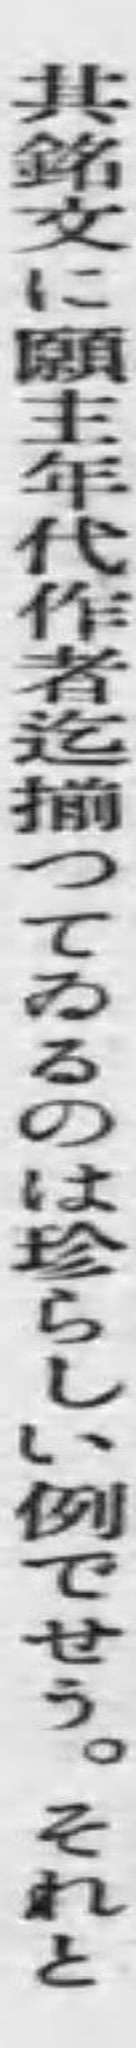其銘文に願主年代作者迄揃つてゐるのは珍らしい例でせう。それと
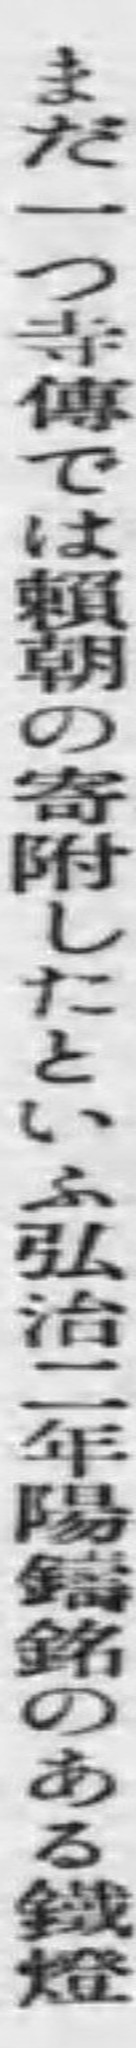まだ一つ寺伝では頼朝の寄附したといふ弘治二年陽鋳銘のある鉄灯
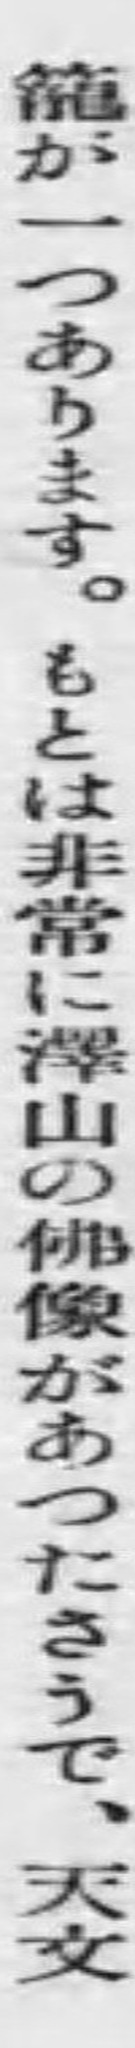籠が一つあります。もとは非常に沢山の仏像があつたさうで、天文
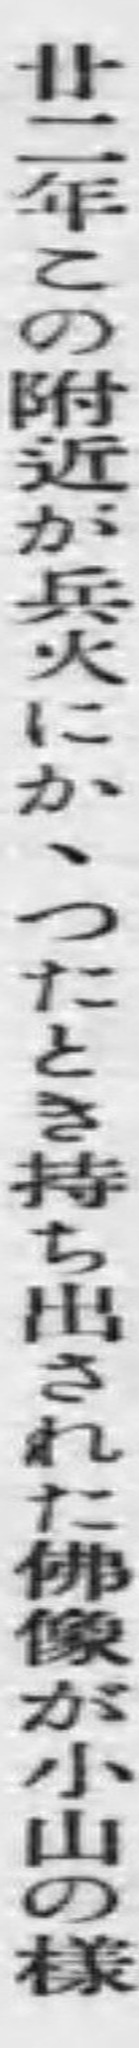廿二年この附近が兵火にかゝつたとき持ち出された仏像が小山の様
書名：東三河道中記 : 豊橋市及其附近案内
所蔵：国立国会図書館 National Diet Library, JAPAN
